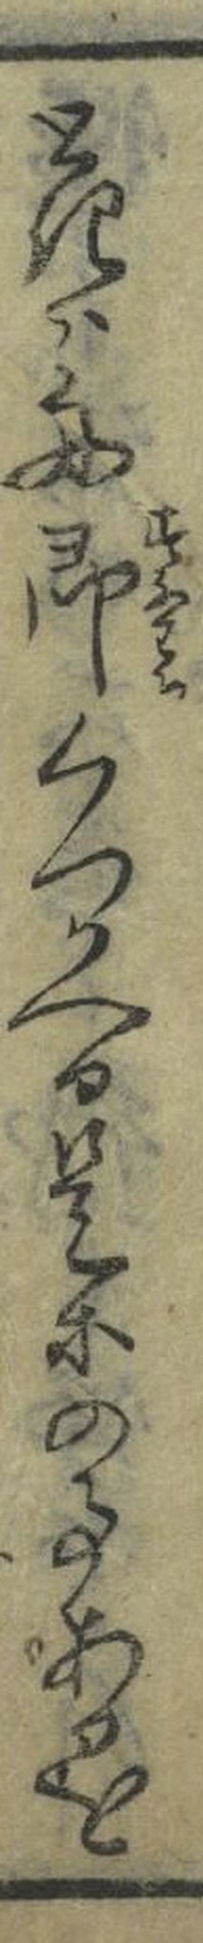ときは舟即くつかへる是等の事あるを
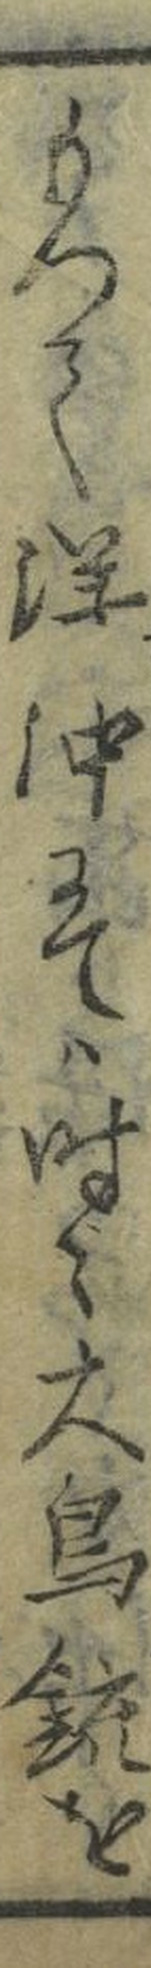もつて洋沖にては時々大鳥銃を
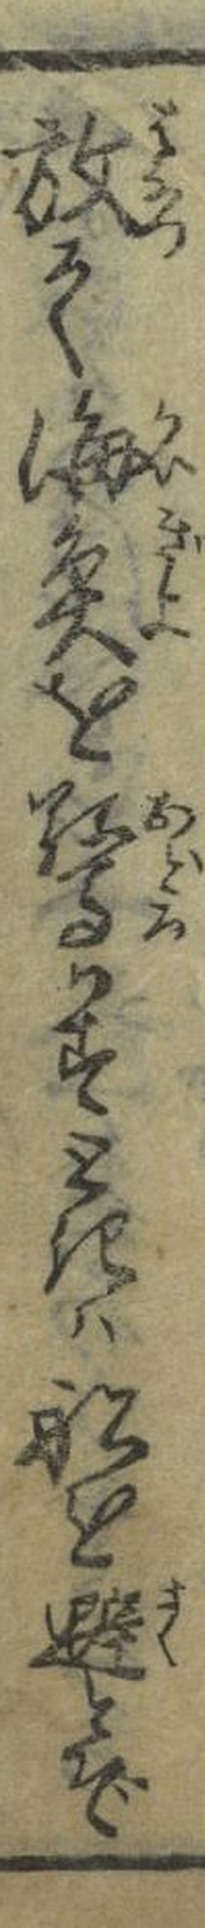放て海魚を驚かすときは船を避とぞ
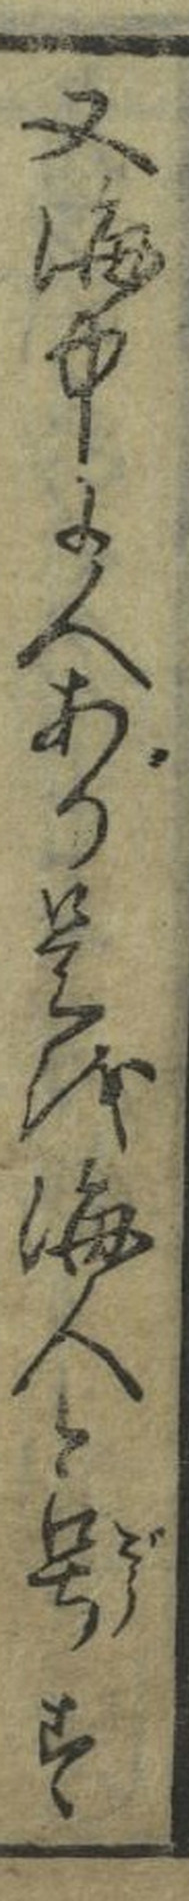又海中に人あり是を海人と号す
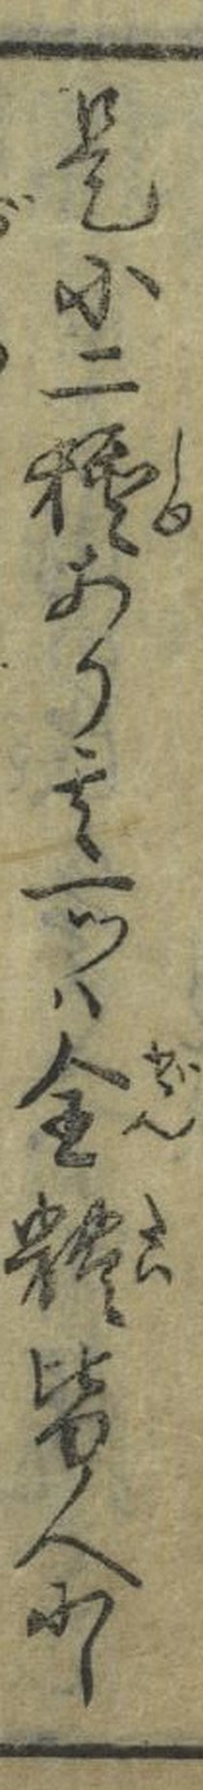是に二種あり其一ツは全体皆人にし
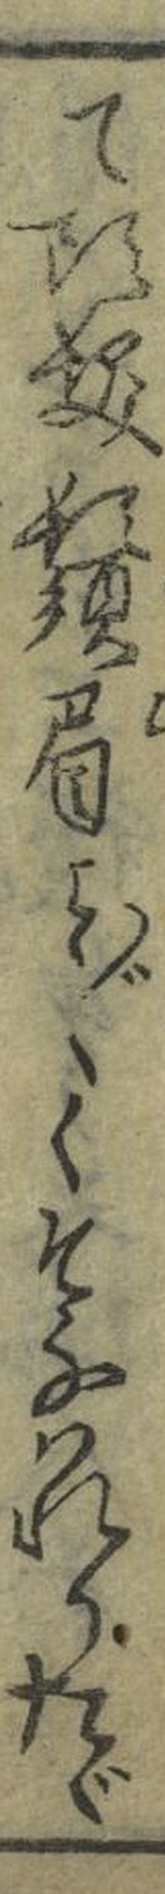て頭髪鬚眉こと〴〵くそなはれりたゞ
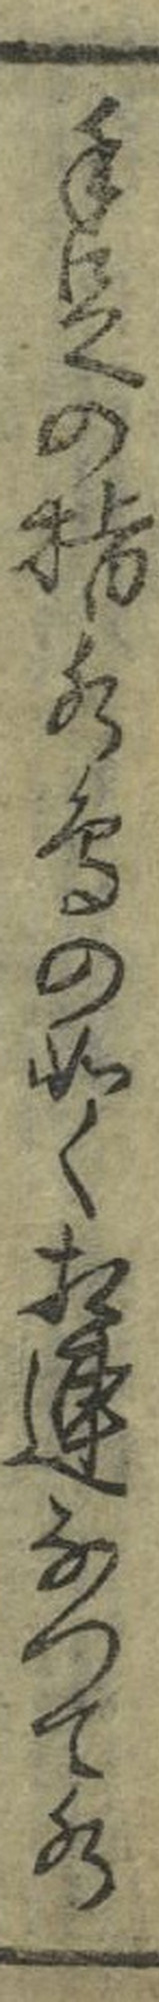手足の指水鳥の如く相連なつて水
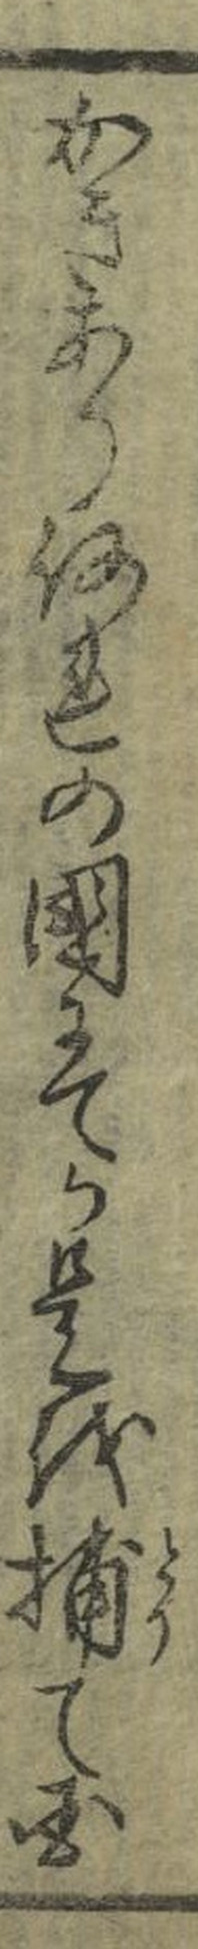かきあり何れの国にてか是を捕て国
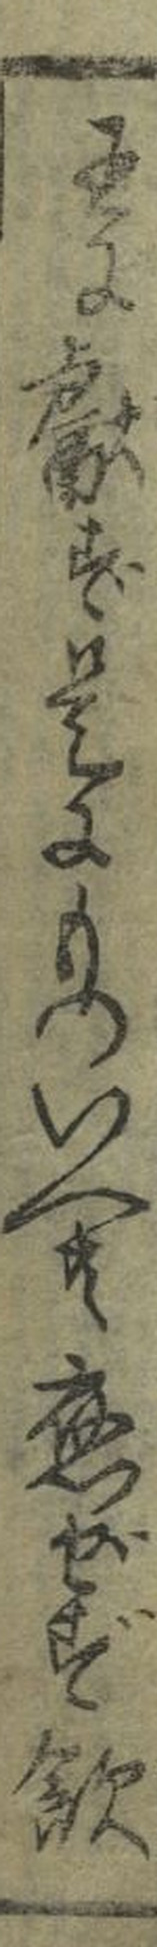王に献ず是にものいへ共応ぜず飲

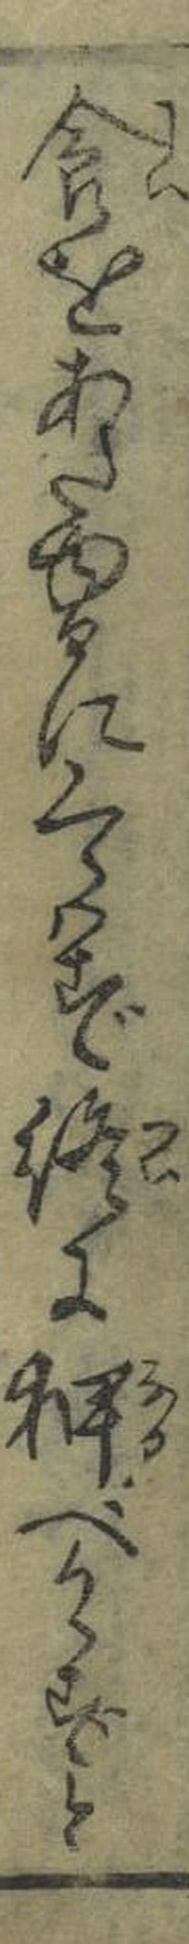食をあたゆるにくらはず終に狎べからずと
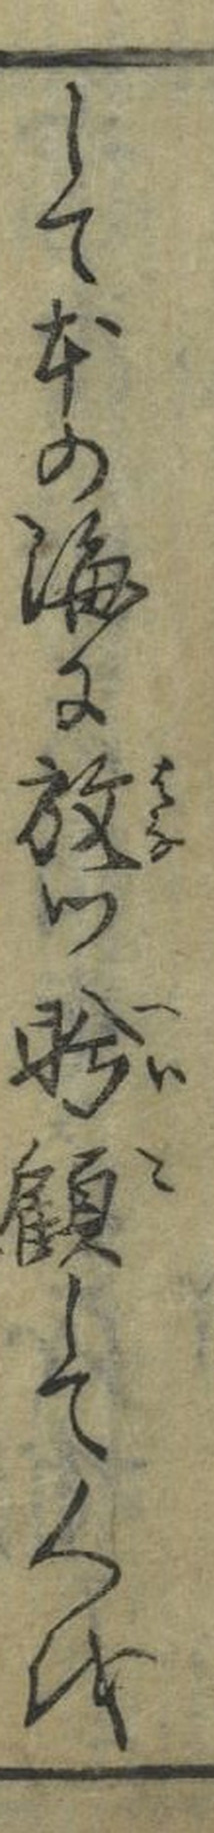して本の海に放つ盻顧して人を
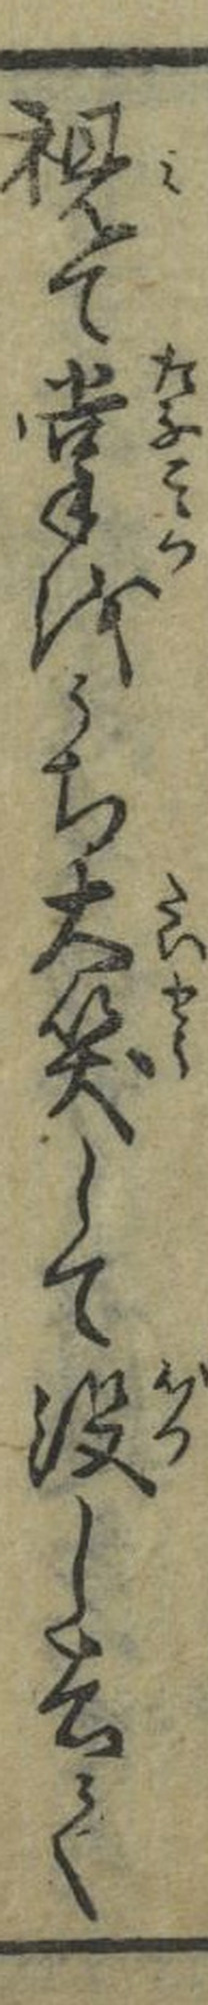視て掌をうち大笑して没し去て
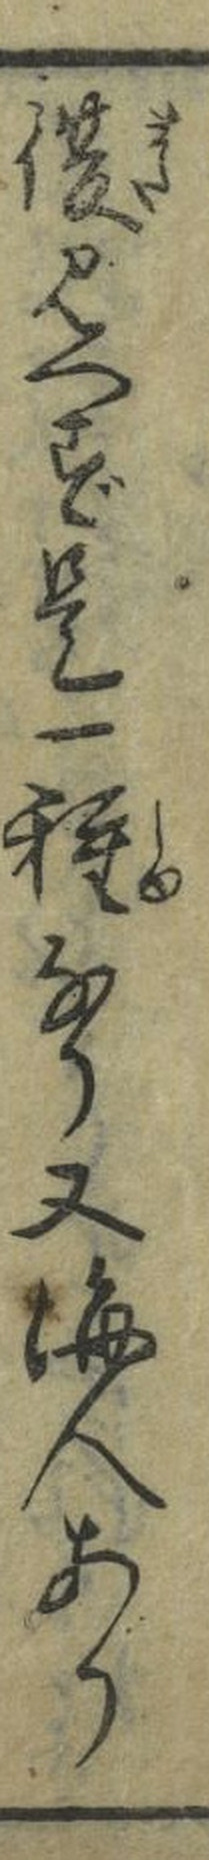復見へず是一種なり又海人あり
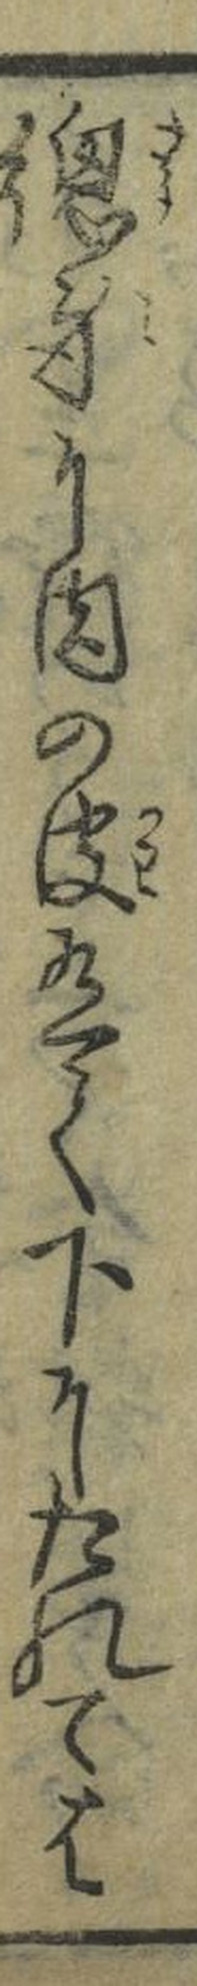総身に肉の皮有て下にたれては
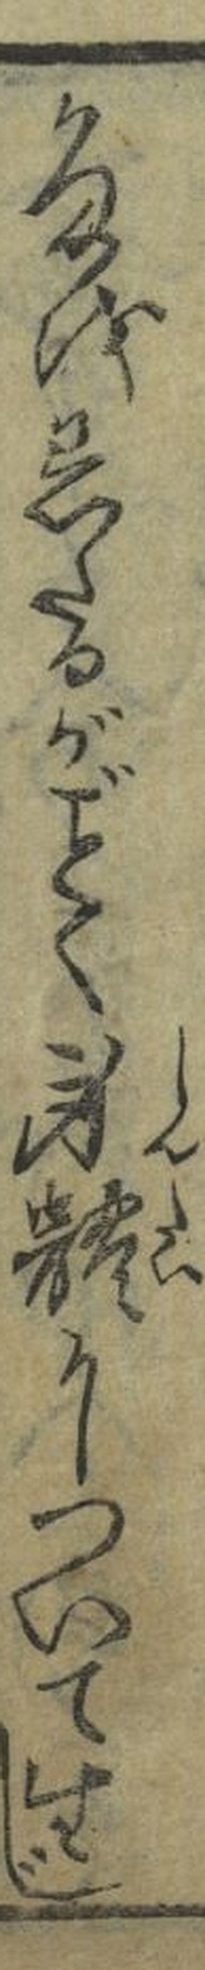かまを着たるがごとく身体について生じ
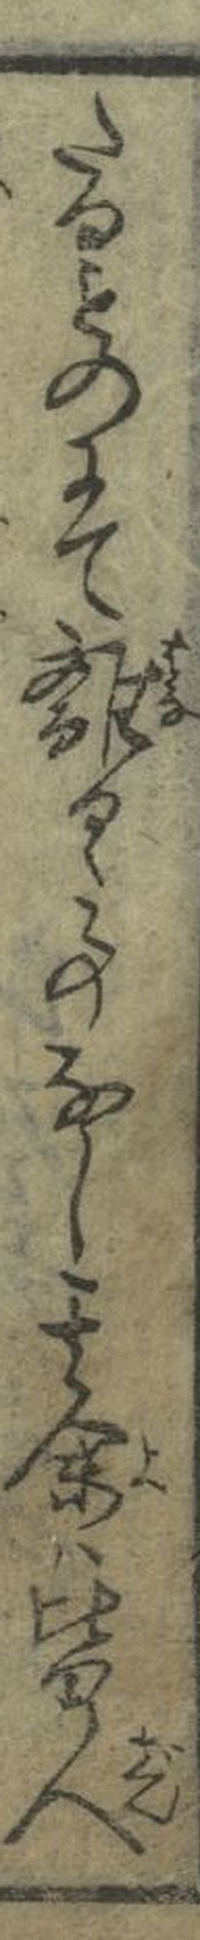たるものにて離るゝ事なし其余は皆人
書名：琉球雑話
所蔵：University of the Ryukyus Library
